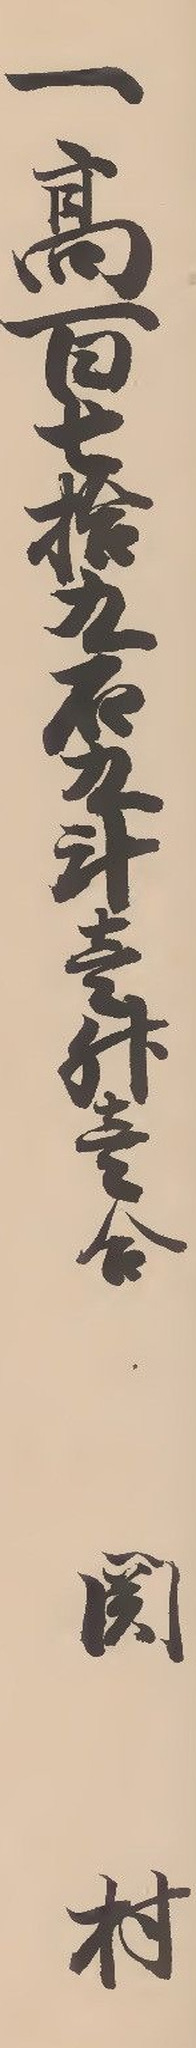一高百七拾九石九斗壱升壱合関村
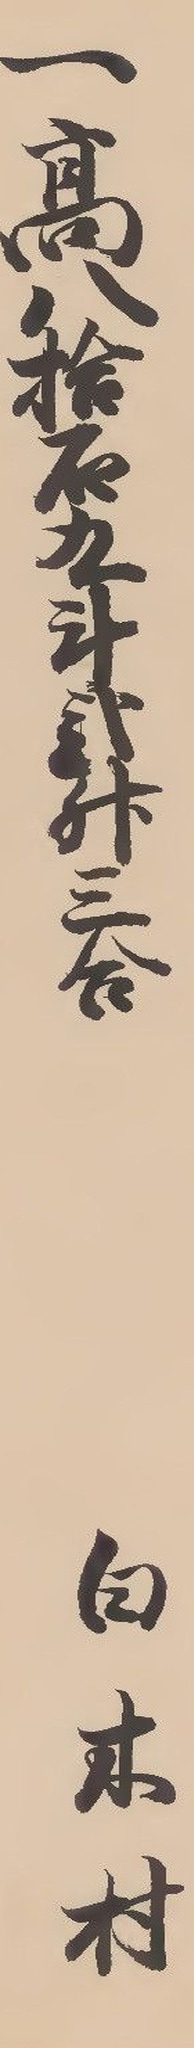一高八拾石九斗弐升三合白木村
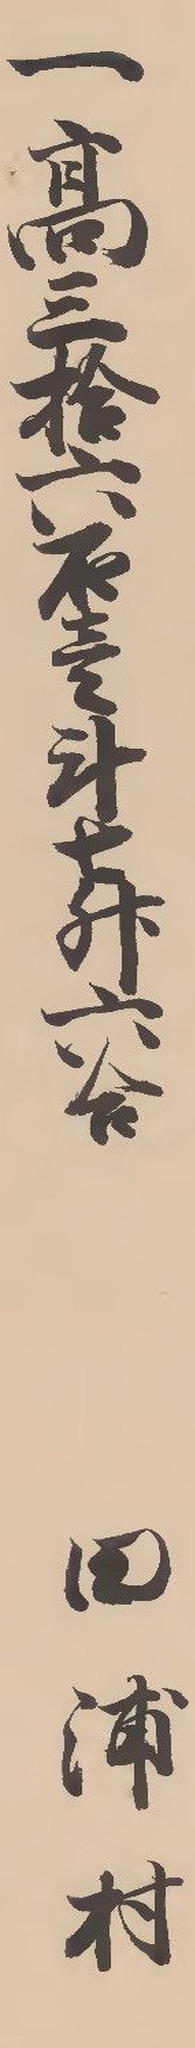一高三拾六石壱斗七升六合田浦村
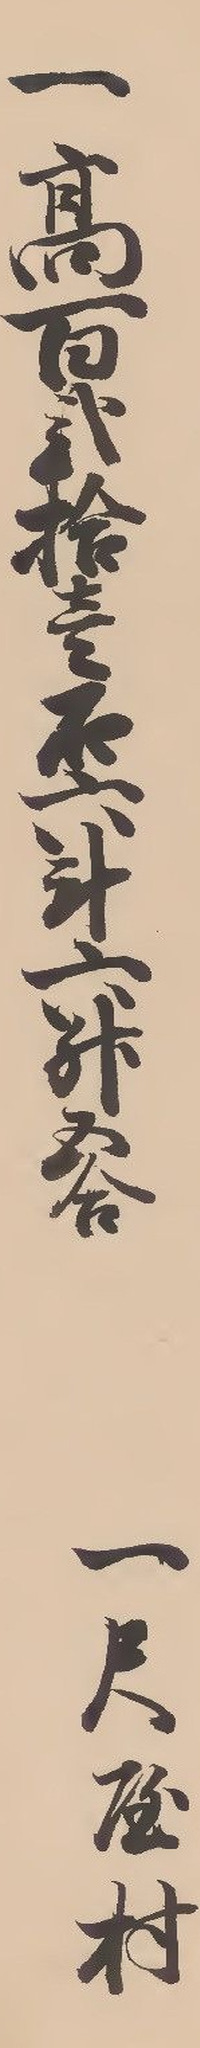一高百弐拾壱石六斗六升五合一尺屋村

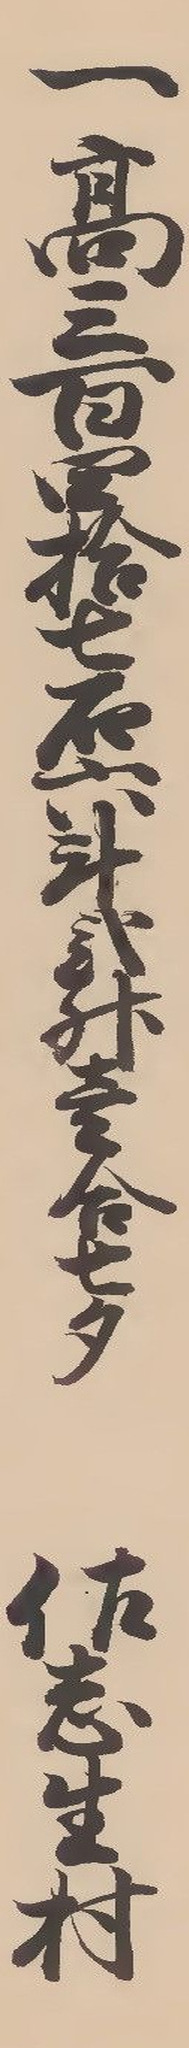一高三百四拾七石六斗弐升壱合七勺佐志生村
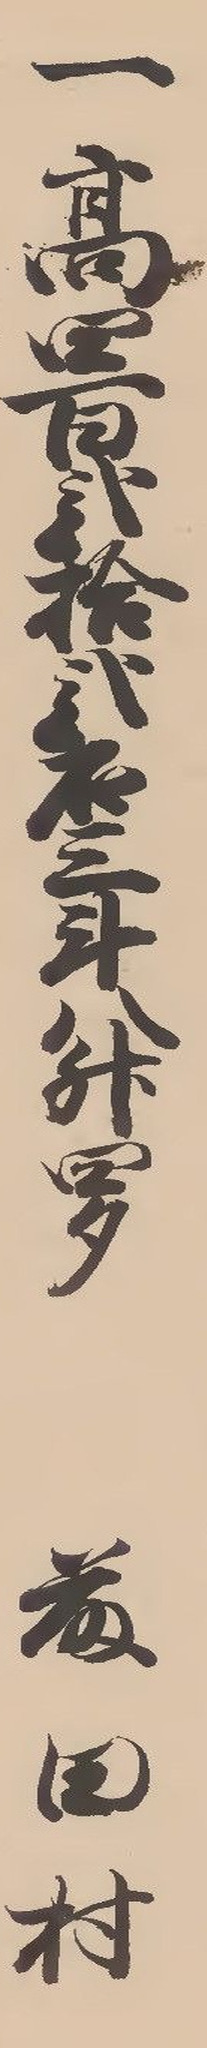一高四百弐拾弐石三斗八升四勺藤田村
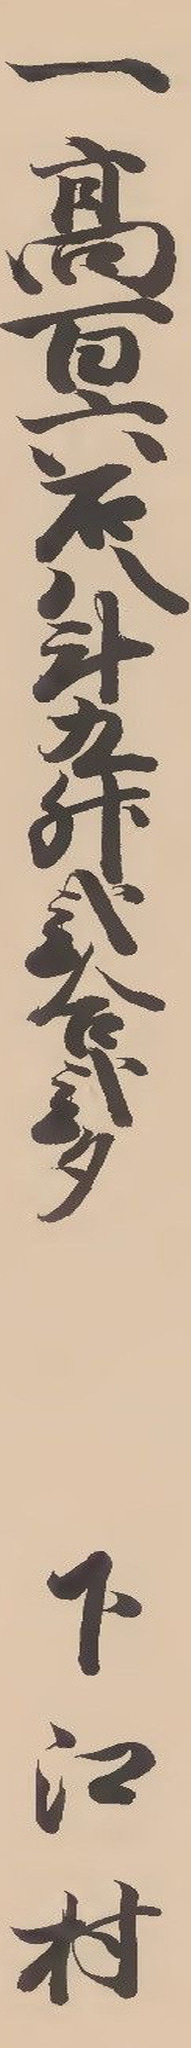一高百六石八斗九升弐合弐勺下江村
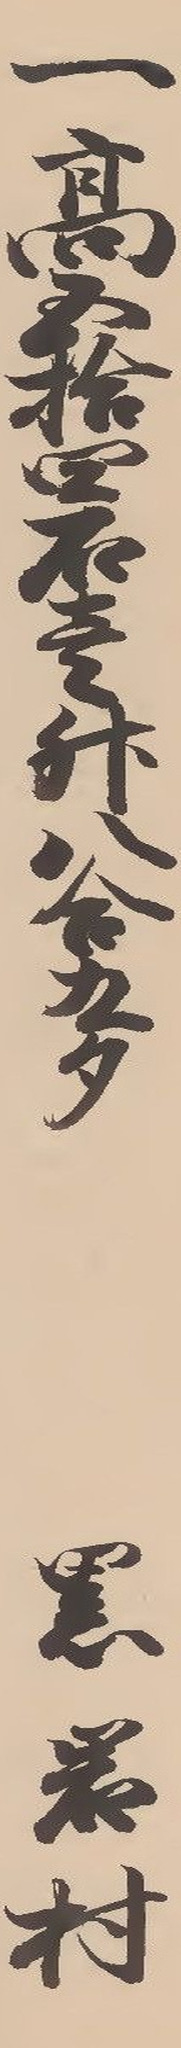一高五拾四石壱升八合九勺黒岩村
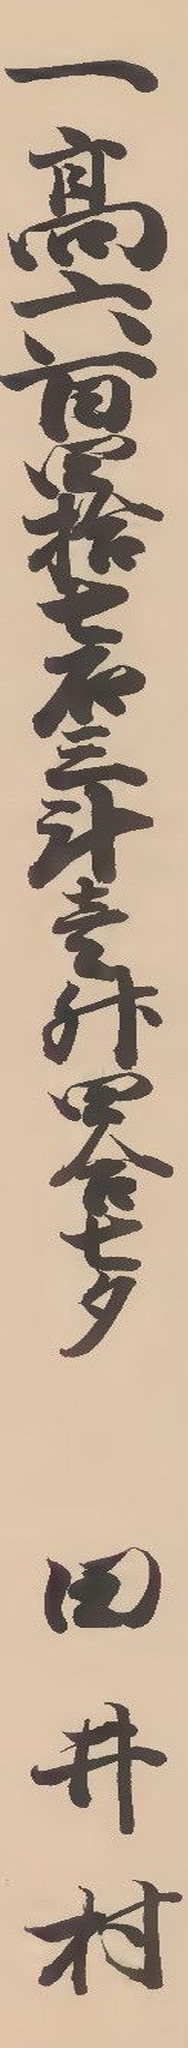一高六百四拾七石三斗壱升四合七勺田井村
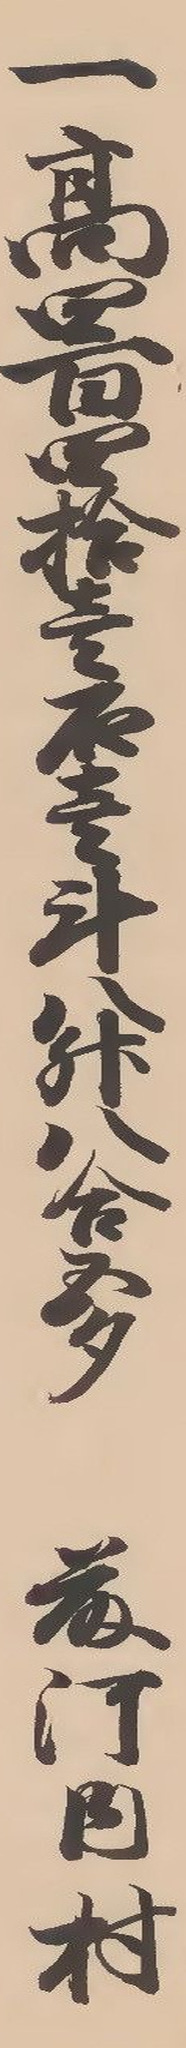一高四百四拾壱石壱斗八升八合五勺藤河内村
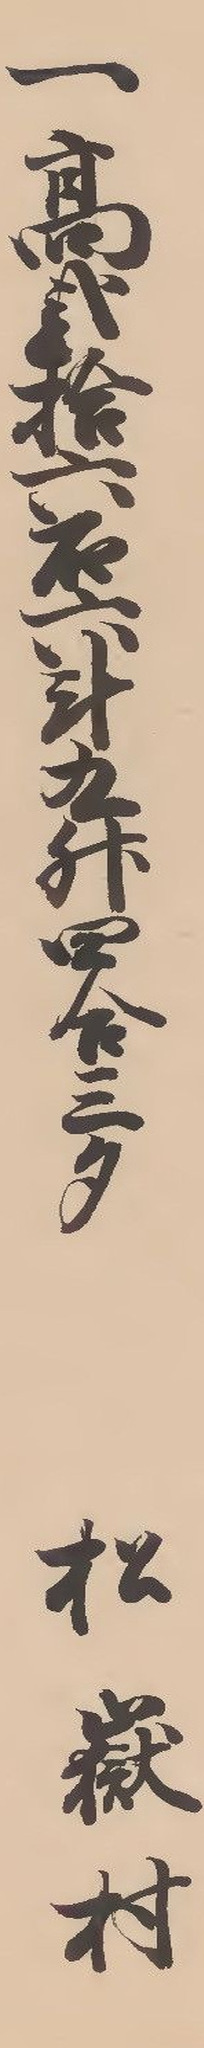一高弐拾六石六斗九升四合三勺松嶽村
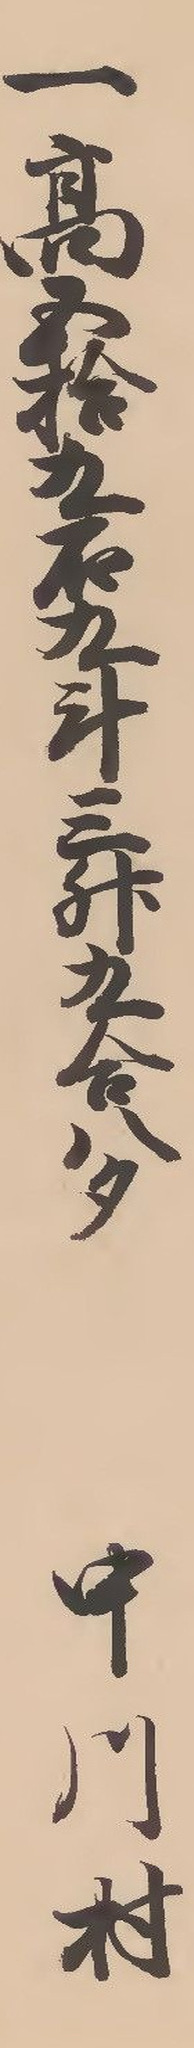一高五拾九石九斗三升九合八勺中川村

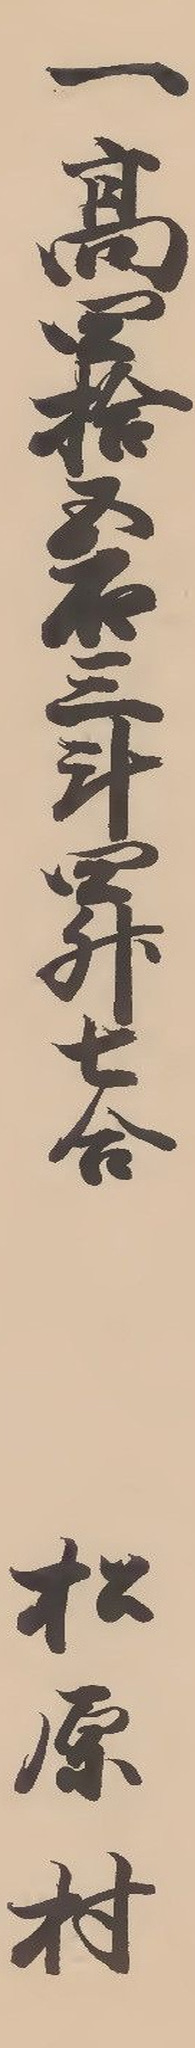一高四拾五石三斗四升七合松原村
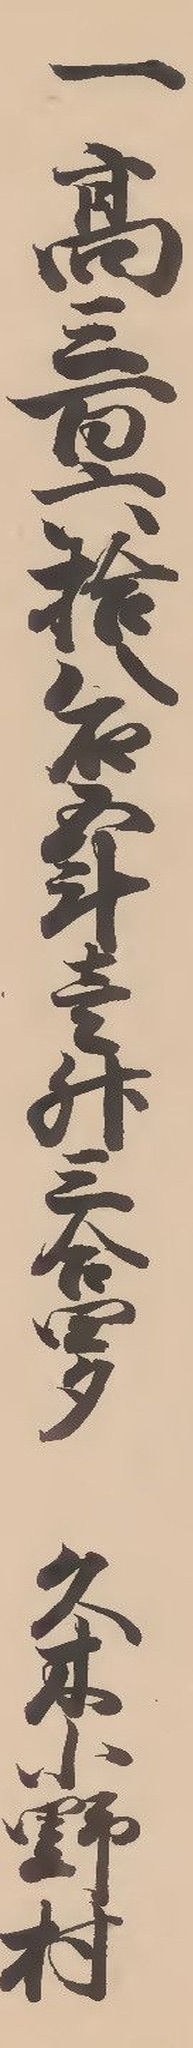一高三百六拾八石五斗壱升三合四勺久木小野村
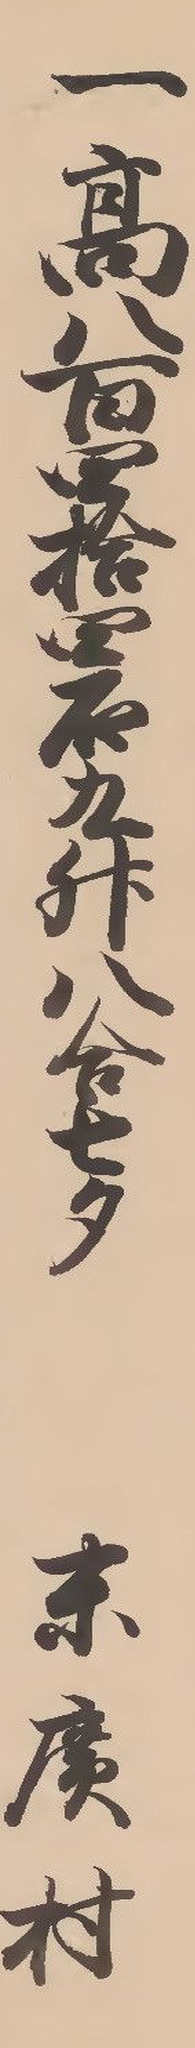一高八百四拾四石九升八合七勺末広村
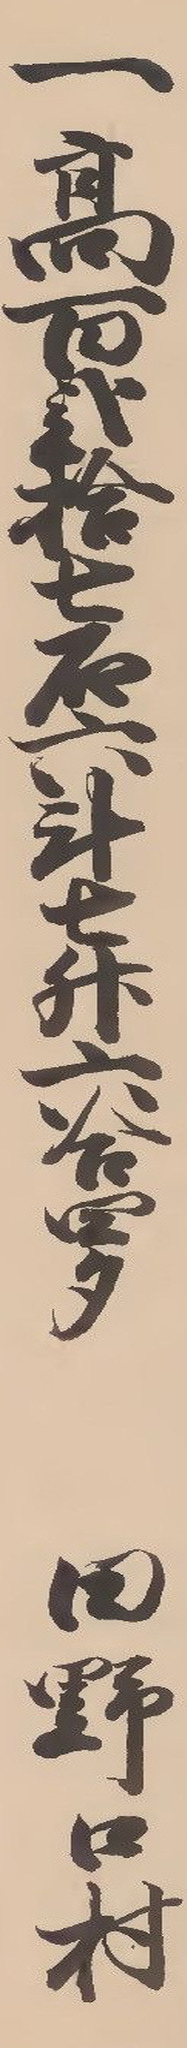一高百弐拾七石六斗七升六合四勺田野口村
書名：豊後国郷帳
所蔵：国立公文書館 National Archives of Japan
